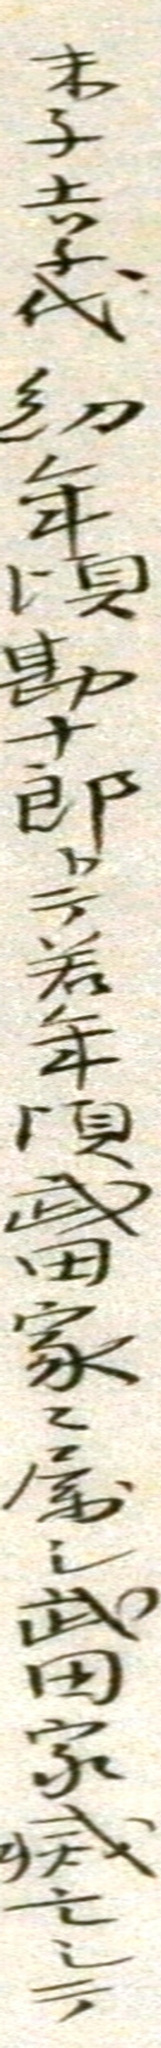末子吉千代幼年頃勘十郎トテ若年頃武田家ニ属シ武田家滅亡シテ
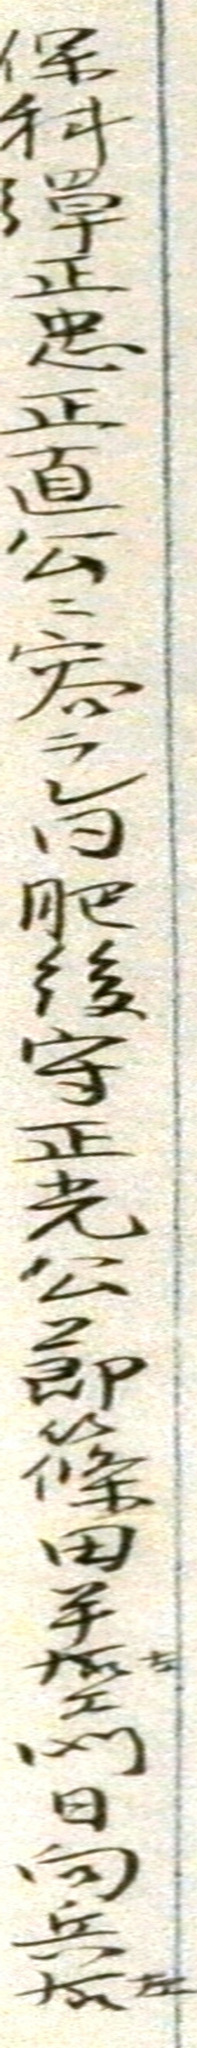保科弾正忠正直公ニ客ラレ同肥後守正光公節篠田半左衛門日向兵左
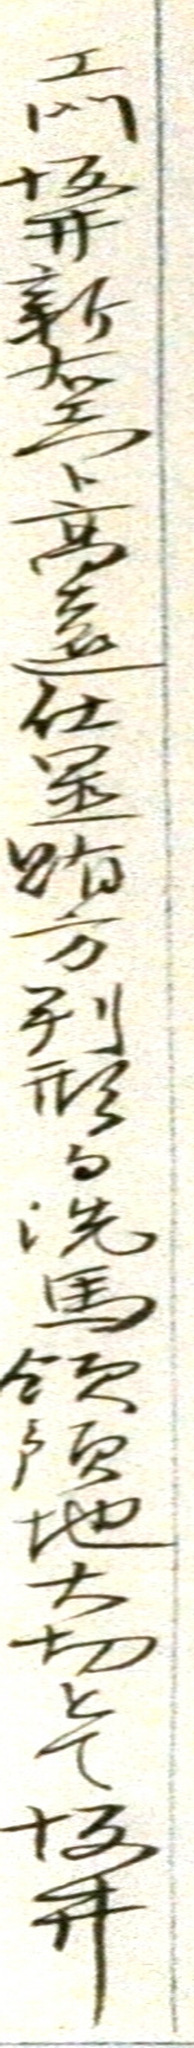エ門坂井新右エ門ト高遠仕置賄方判形而洗馬領預地大切とて坂井

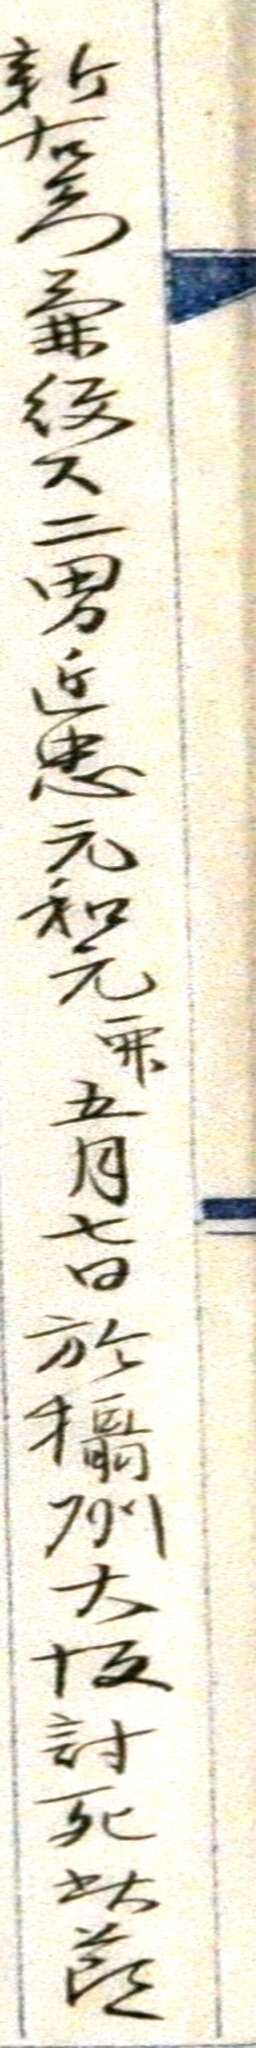新右エ門兼役ス二男近忠元和元◻︎五月七日於摂州大坂討死此節
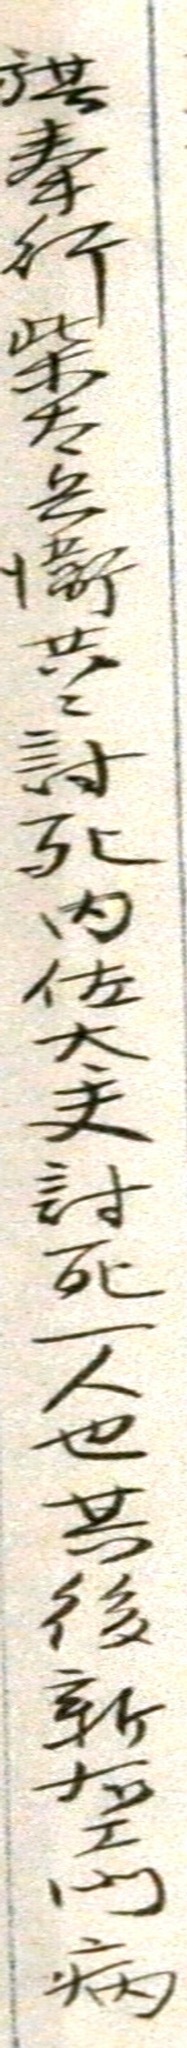旗奉行柴太兵衛共々討死内佐太夫討死一人也其後新右エ門病
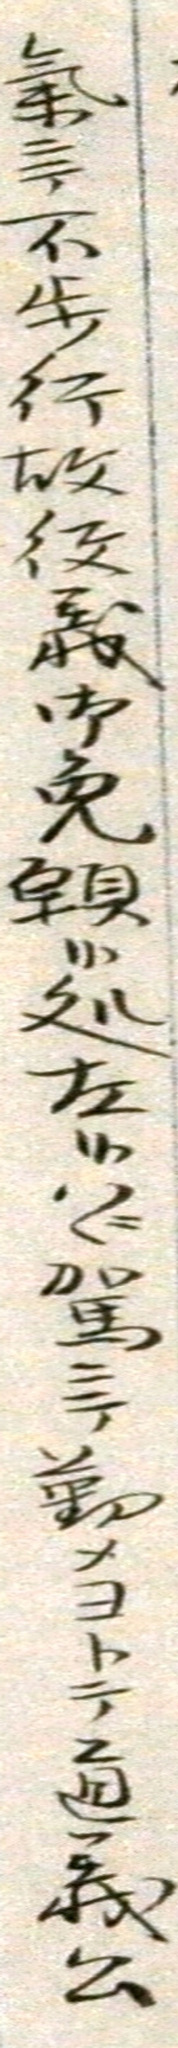気ニテ不歩行故役義御免願候処左候ハバ駕ニテ勤メヨトテ通義公
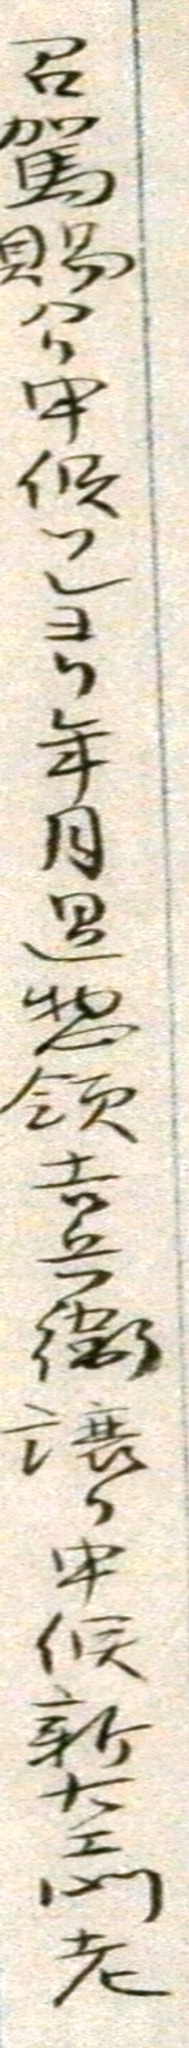召駕賜ハリ申役ソレヨリ年月過惣領吉兵衛譲リ申候新右エ門老
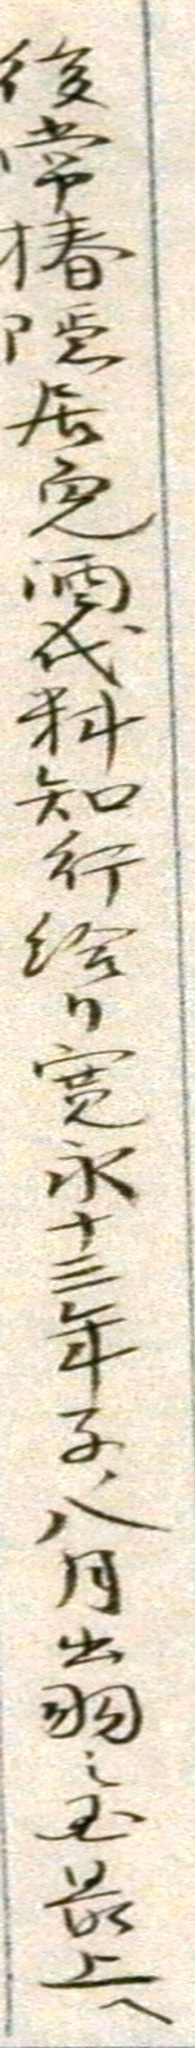後常椿隠居免酒代料知行給リ寛永十三年子ノ八月出羽之国最上ヘ
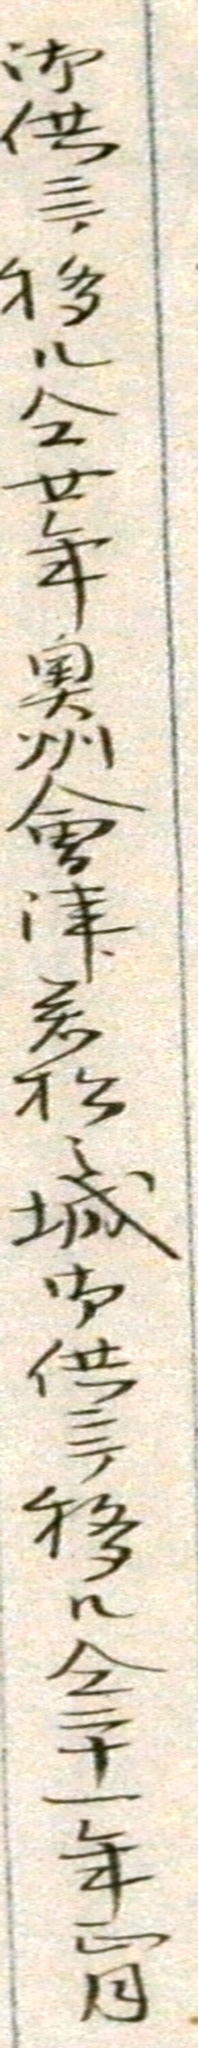御供ニテ移ル同廿年奥州会津若松之城御供ニテ移ル同二十一年正月
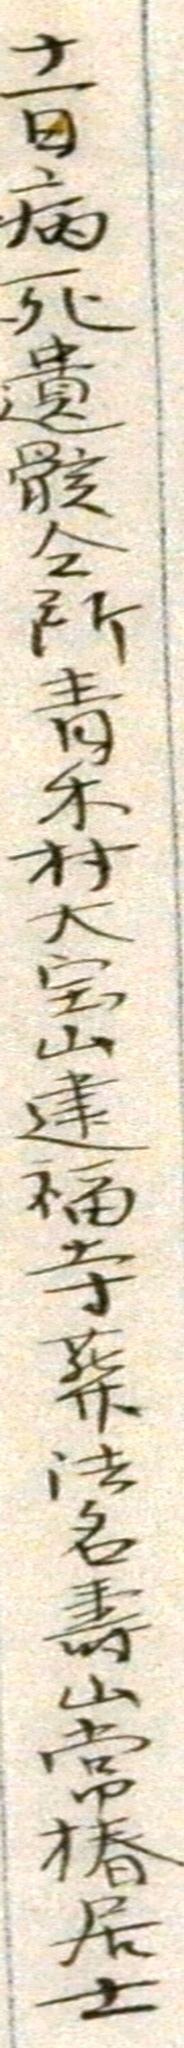十一日病死遺骸同所青木村大宝山建福寺葬法名壽山常椿居士
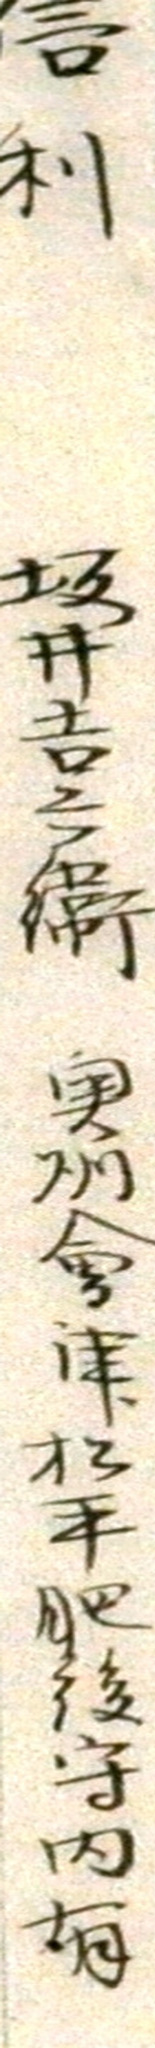信利坂井吉兵衛奥州会津松平肥後守内有
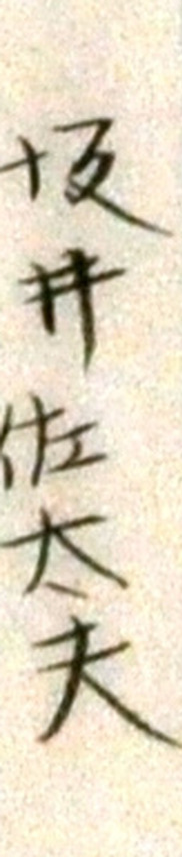近忠坂井佐太夫
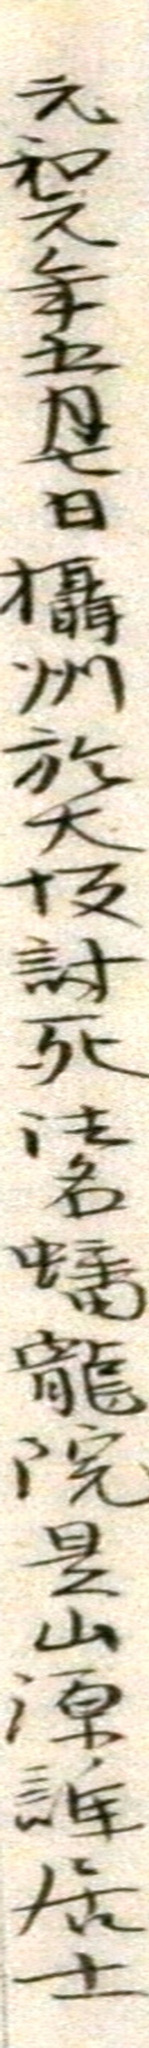元和元年五月七日摂州於大坂討死法名蟠龍院是山源誰居士
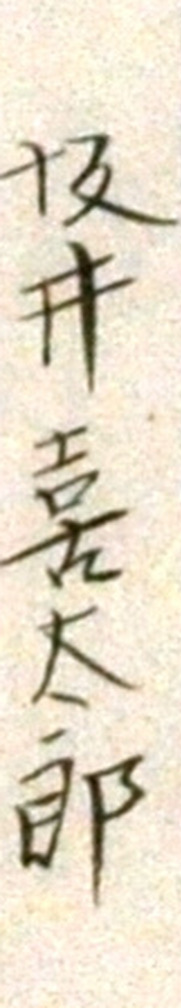信道坂井喜太郎
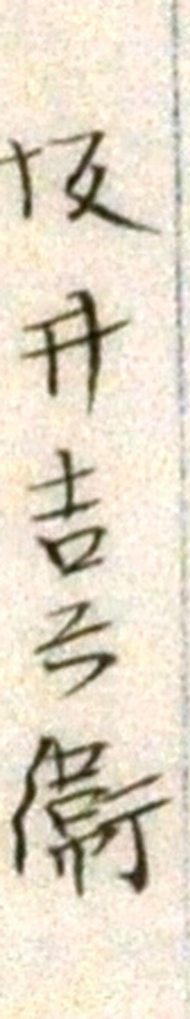信秀坂井吉兵衛
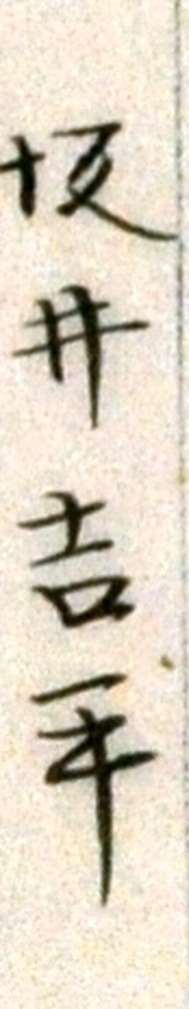坂井吉平
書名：三好氏先代以来勤仕録、池田丈介一家勤仕録
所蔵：伊那市立高遠町図書館・合同会社AMANE
